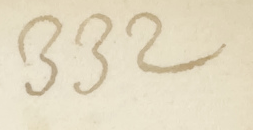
332
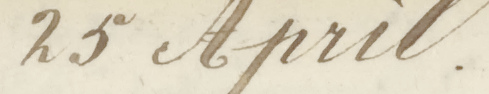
25 April.
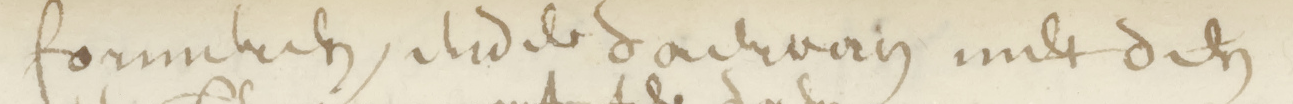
formeren, ende daervan met den
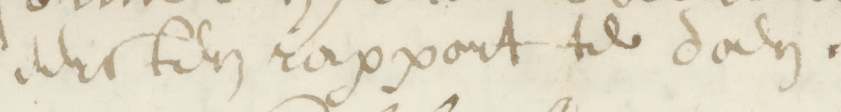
eersten rapport te doen.
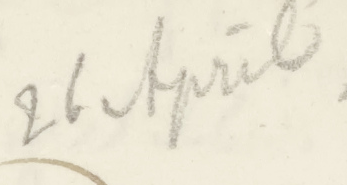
36 Apul
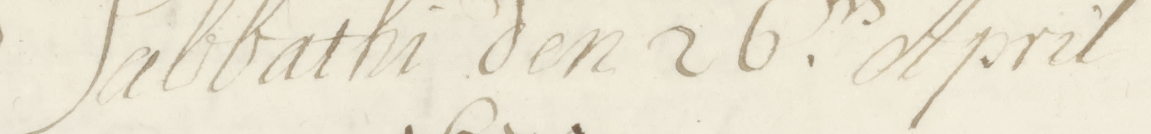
Sabbathi den 26en. April
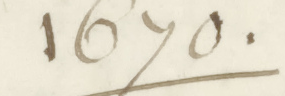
1670.
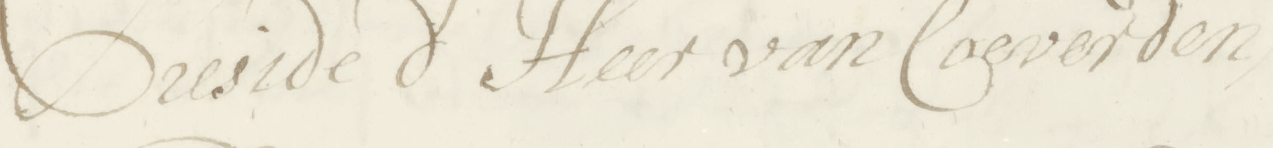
Preside d'Heer van Coeverden,
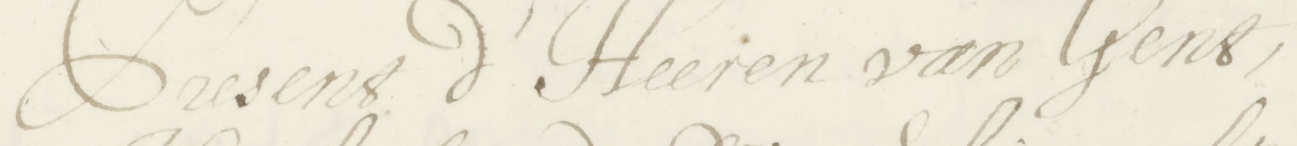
Present d'Heeren van Gent,
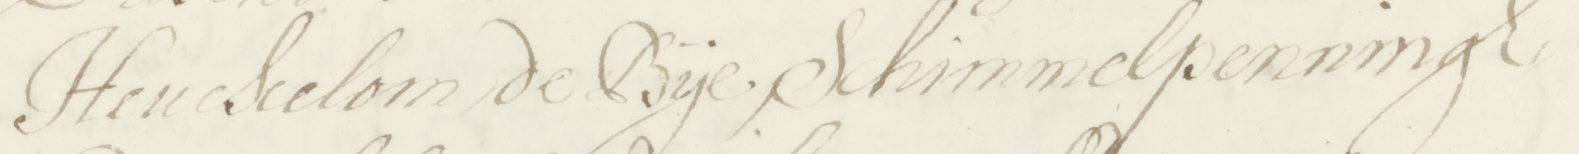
Heuckelom, de Bije, Schimmelpenningh,
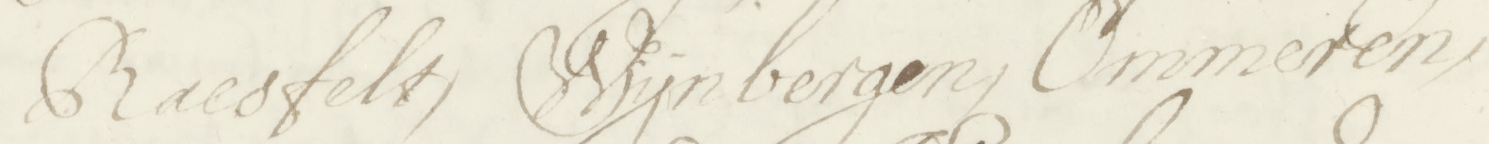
Raesfelt, Wijnbergen, Ommeren,
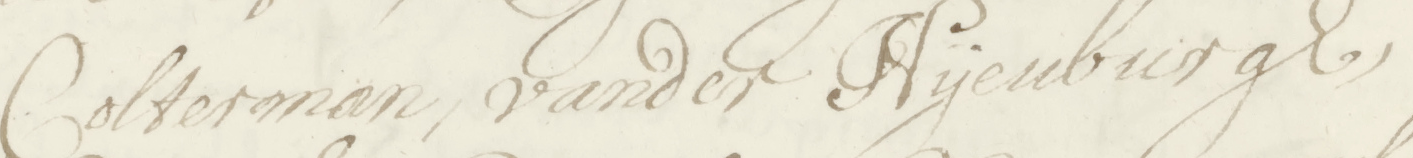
Colterman, vander Nijenburgh,
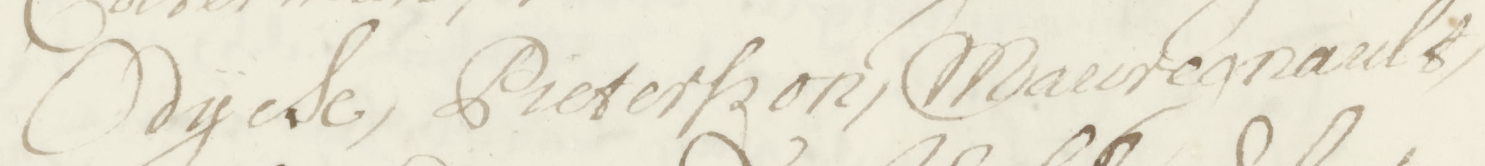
Odijck, Pieterszon, Mauregnault,
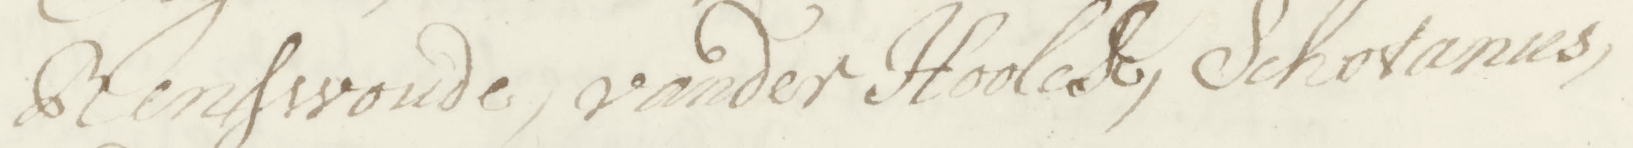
Renswoude, van der Hoolck, Schotanus,
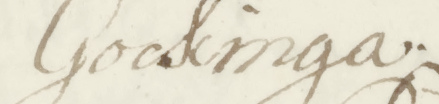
Gockinga.
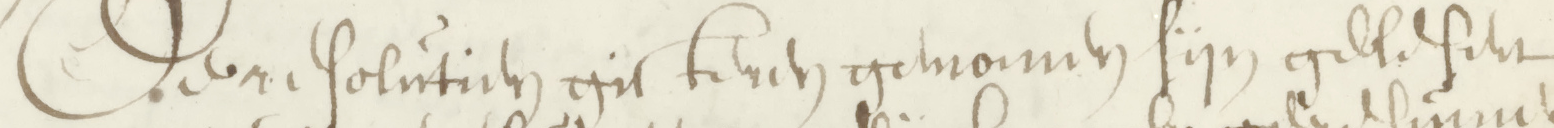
De resolutien gisteren genomen sijn gelesen
